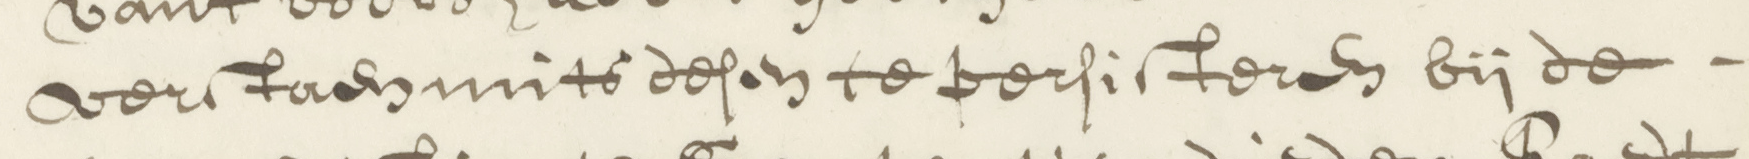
verstaen mits desen te persisteren bij de
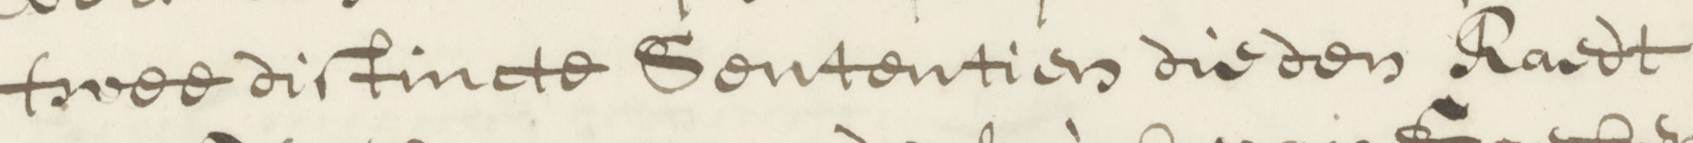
twee distincte Sententien die den Raedt
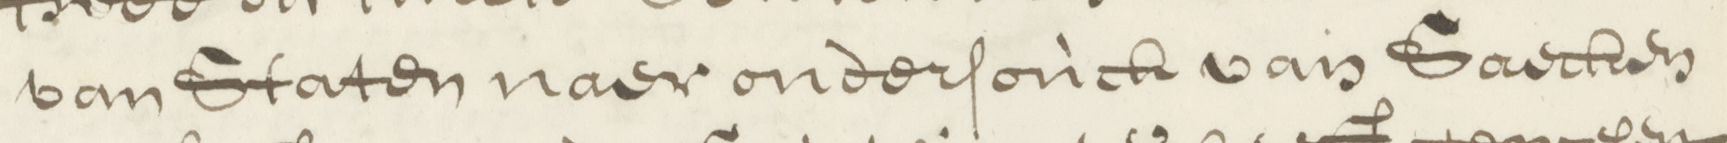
van Staten naer ondersouck van Saecken
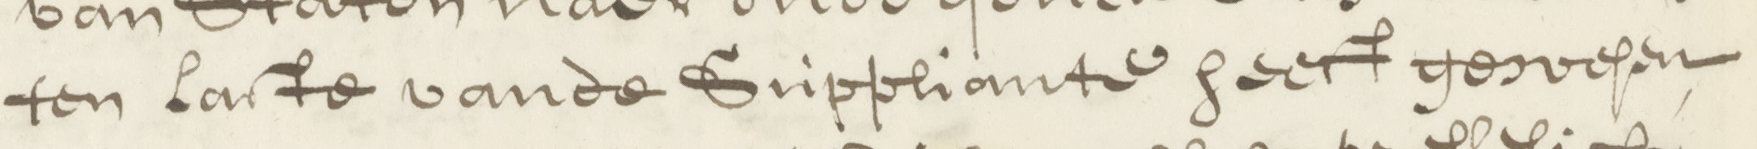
ten laste vande Suppliante heeft gewesen
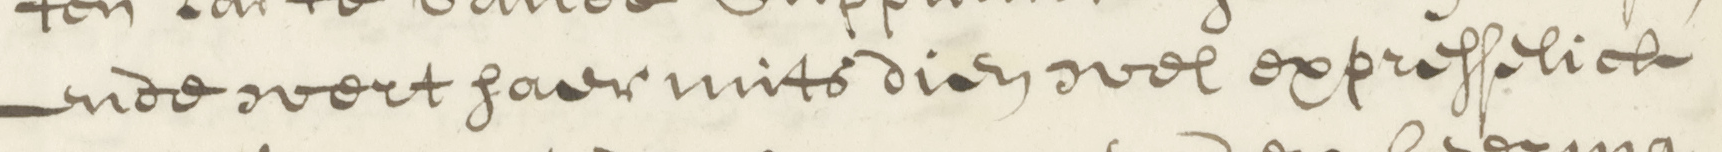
ende wert haer mitsdien wel expresselick
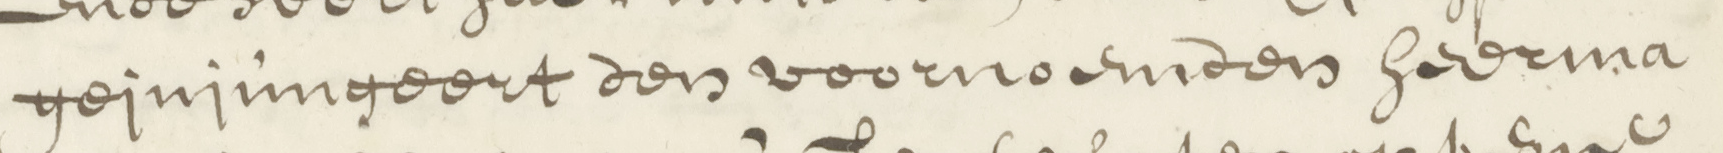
geinjungeert den voornoemden heerma
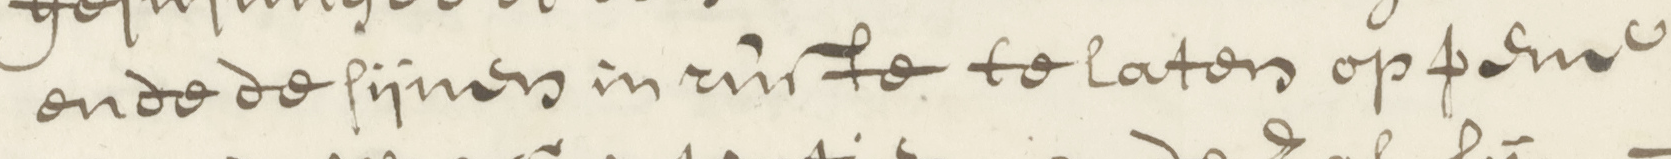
ende de sijnen in ruste te laten op pene
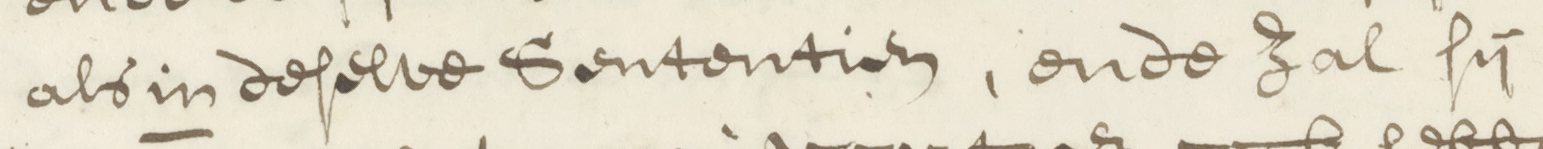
als in deselve Sententien, ende zal sij
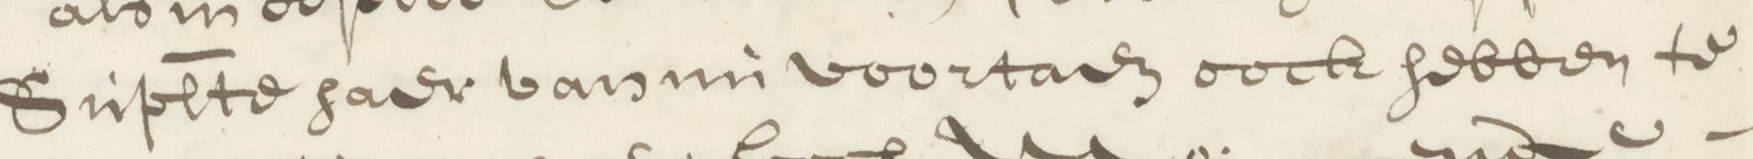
Suplte haer van nu voortaen oock hebben te
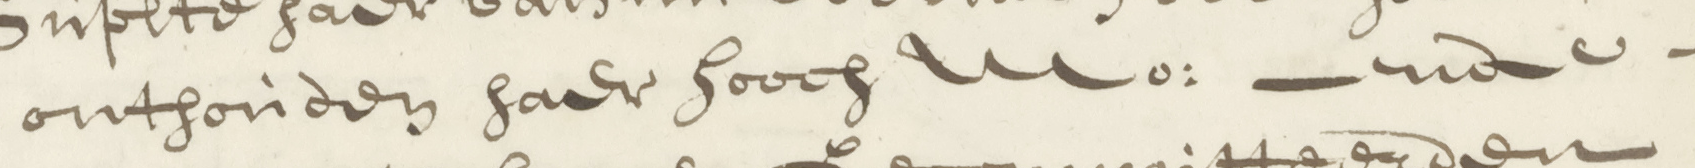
onthouden haer hooch Mo: Ende
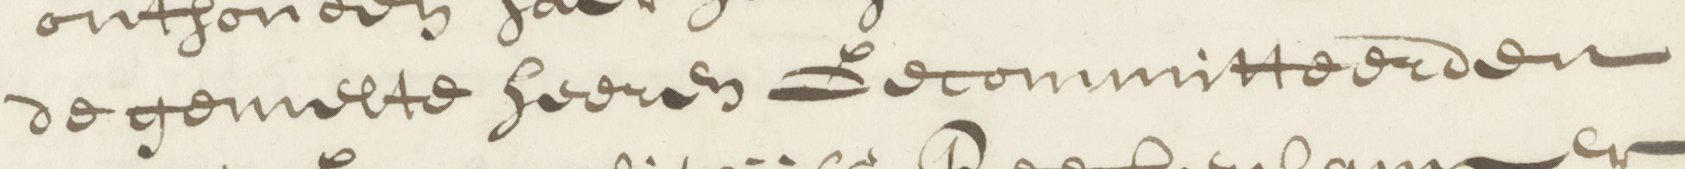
de gemelte heeren Gecommitteerden
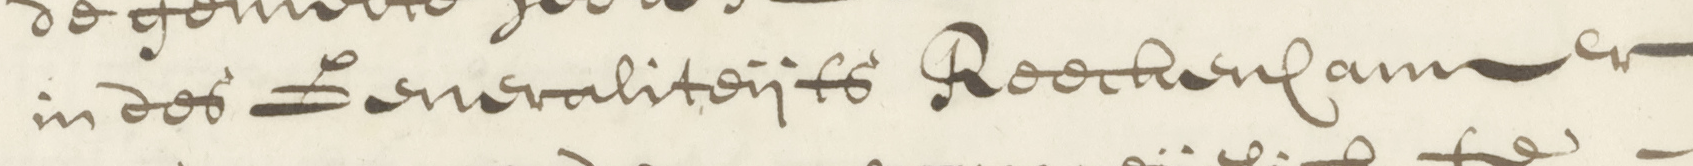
in des Generaliteijts ReeckenCamer
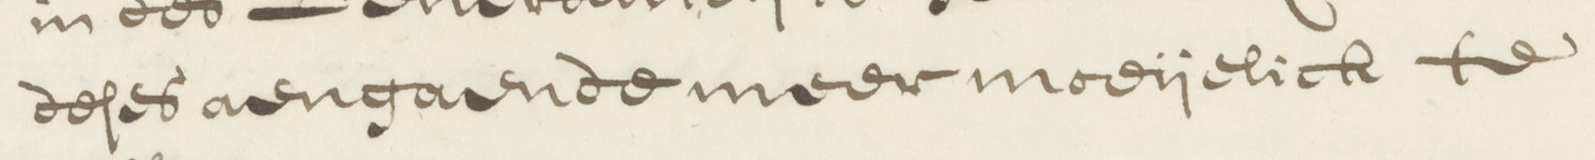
deses aengaende meer moeijelick te
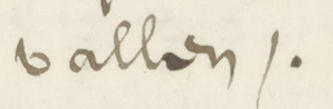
vallen.
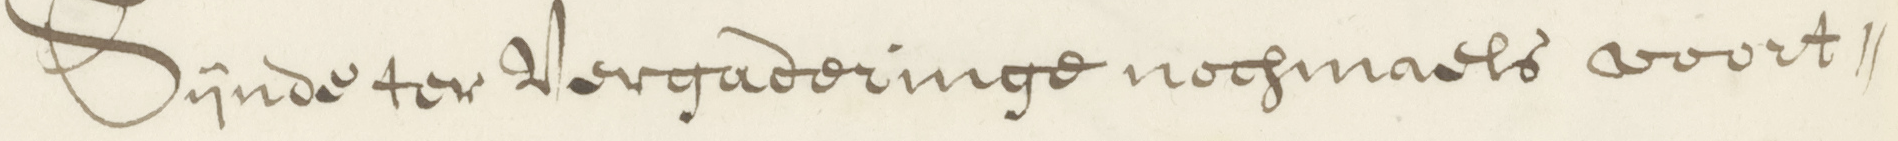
Sijnde ter Vergaderinge nochmaels voort„
